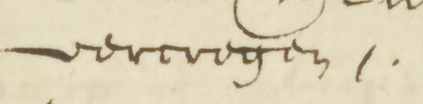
vercregen.
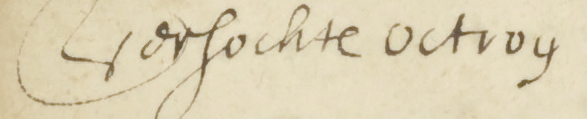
Versochte octroy
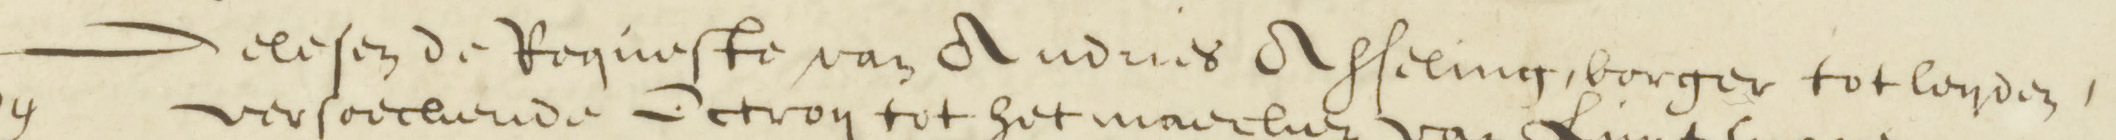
Gelesen de Requeste van Andries Asseling, borger tot leyden,
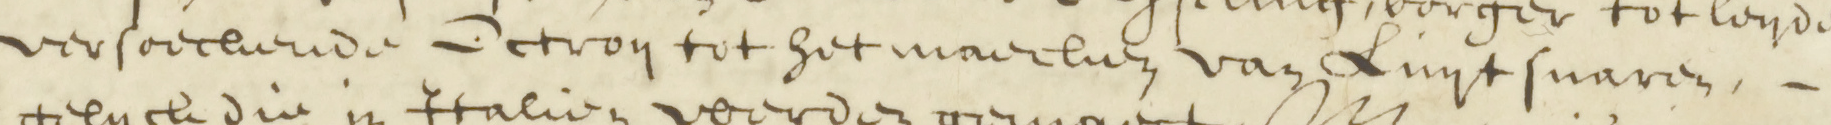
versoeckende Octroy tot het maecken van Luytsnaren, -
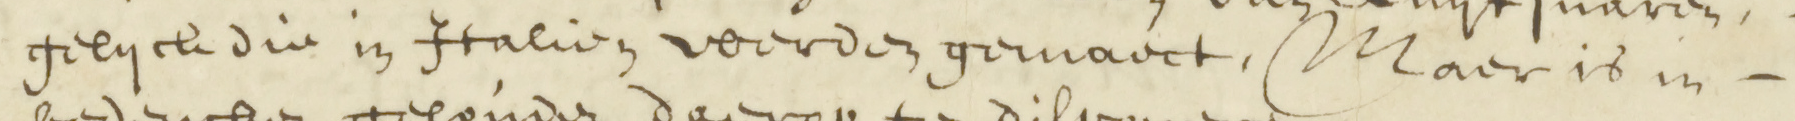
gelyck die in Italien werden gemaect, Maer is in
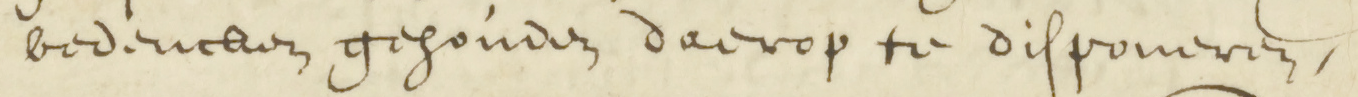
bedencken gehouden daerop te disponeren.
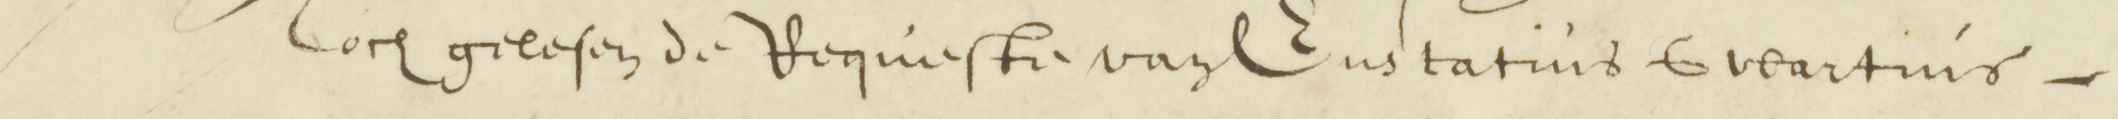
Noch gelesen de Requeste van Eustatius Swartius
